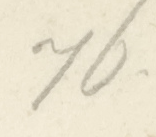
76
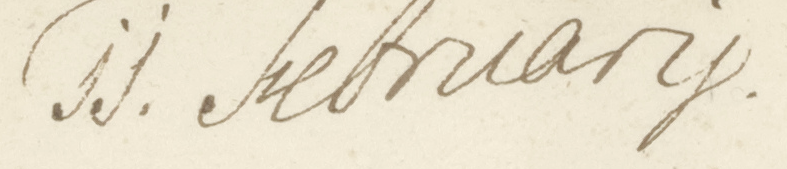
11. Februarij.
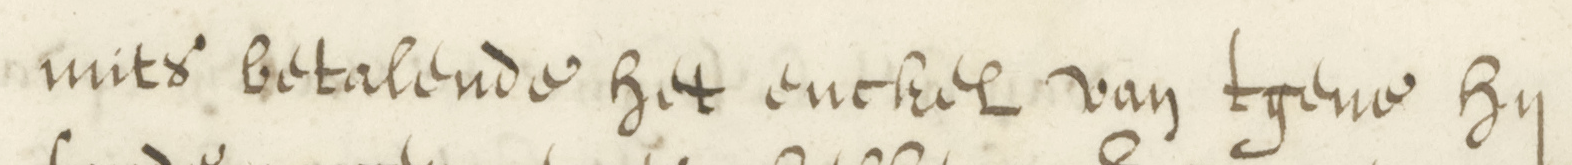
mits betalende het enckel van tgene hy
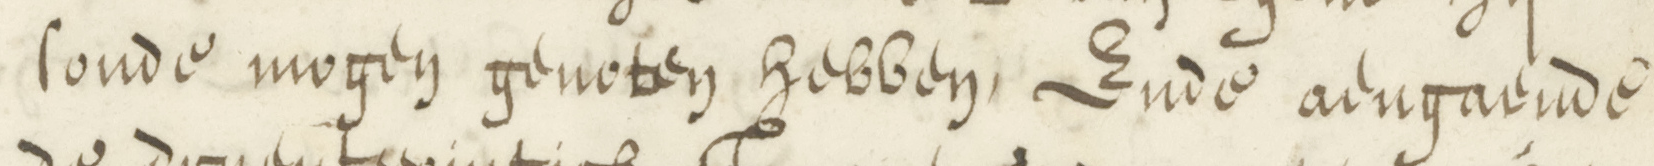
soude mogen genoten hebben. Ende aengaende
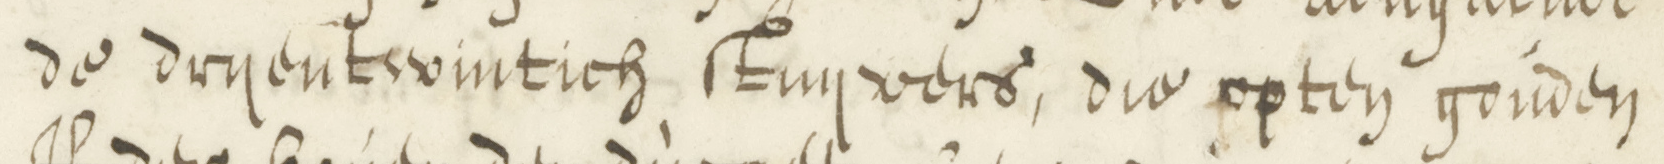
de dryentwintich stuyvers, die opten gouden
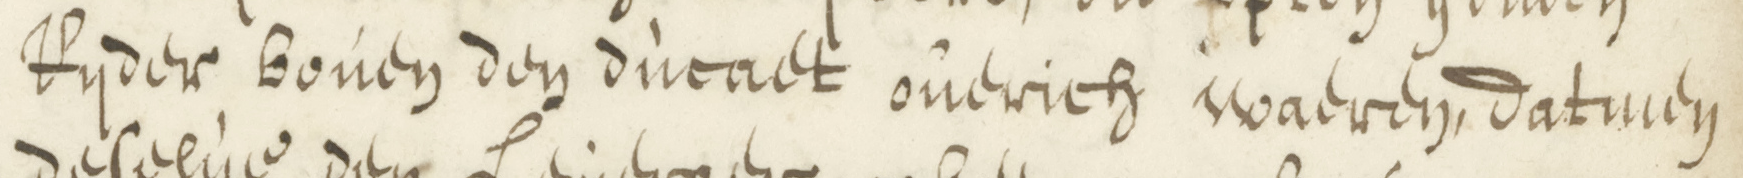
Ryder bouen den ducaet ouerich waeren, datmen
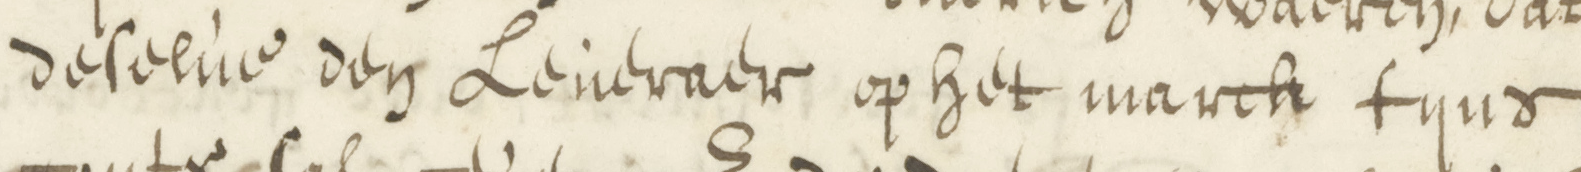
deselue den Leueraer op het marck fyns
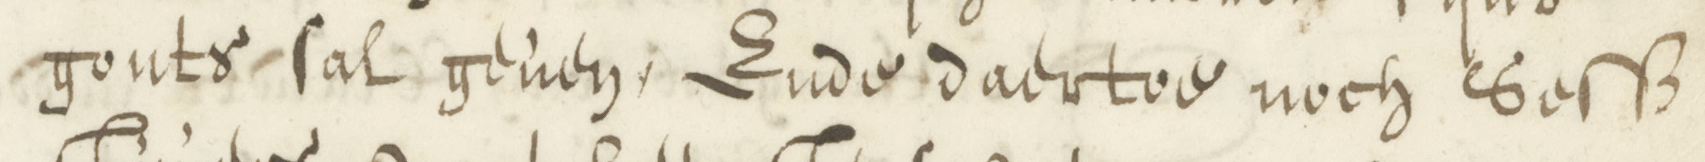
gouts sal geuen, Ende daertoe noch sess
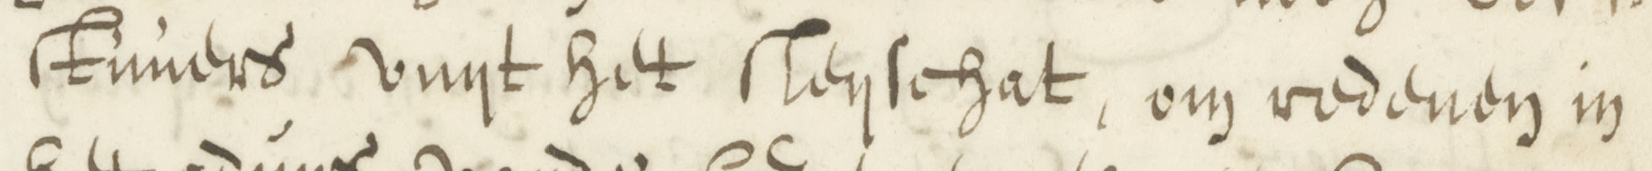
stuuers vuyt het sleyschat, om redenen in
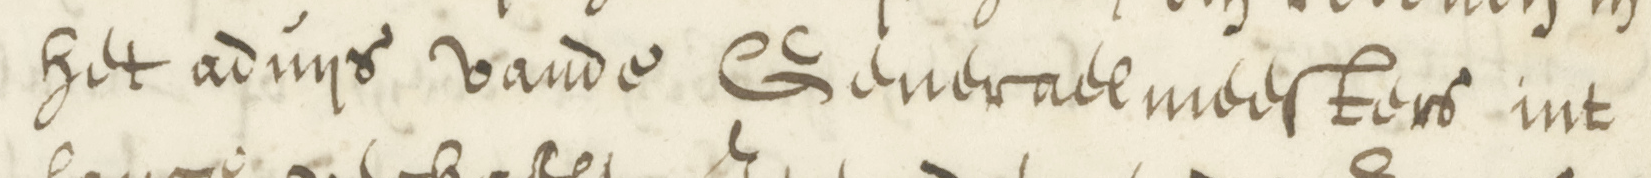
het aduys vande Generaelmeesters int
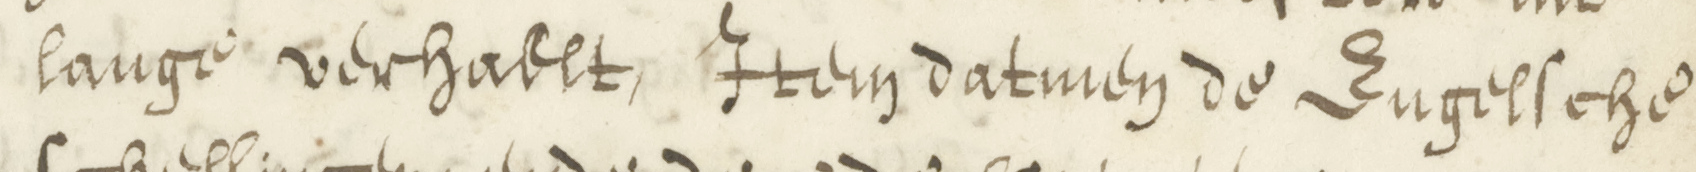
lange verhaelt. Item datmen de Engelsche
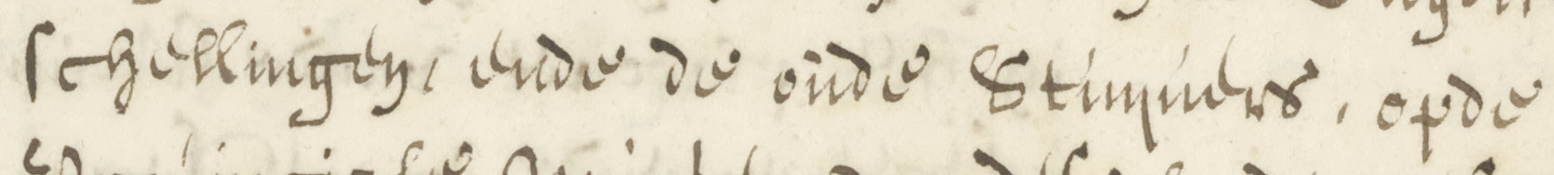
schellingen, ende de oude Stuyuers, opde
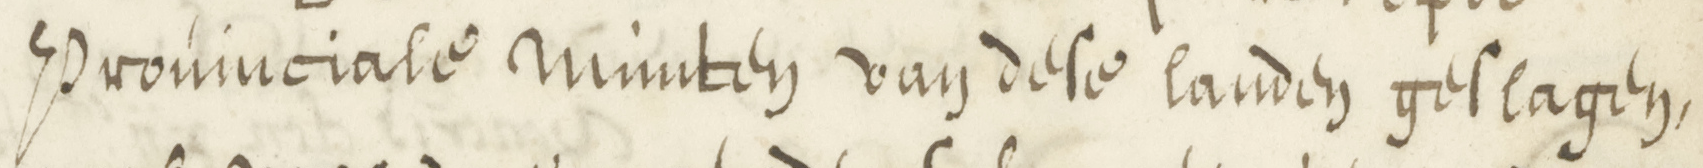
Prouinciale Munten van dese landen geslagen,
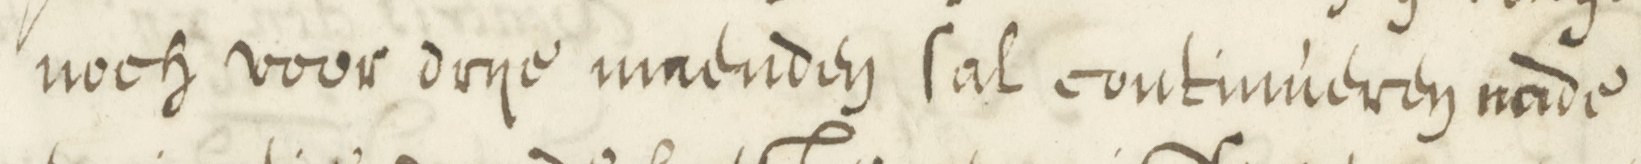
noch voor drye maenden sal continueren nade
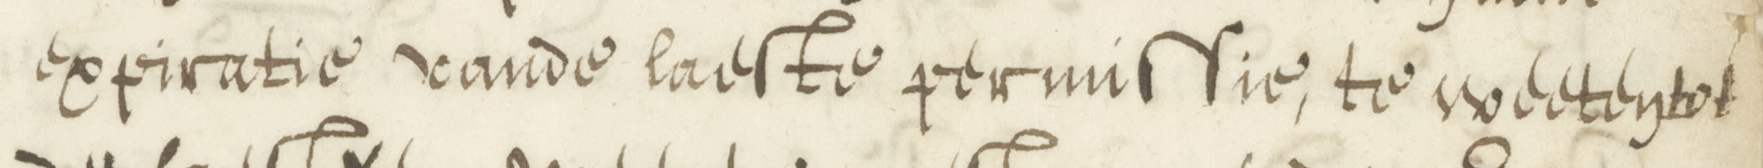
expiratie vande laeste permissie, te weeten tot
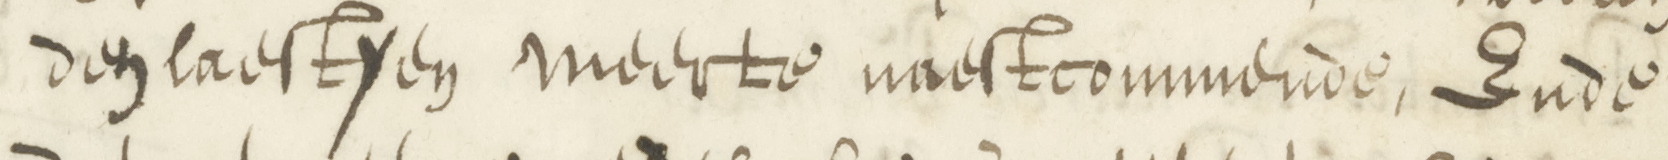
den laestyen meerte naestcommende. Ende
